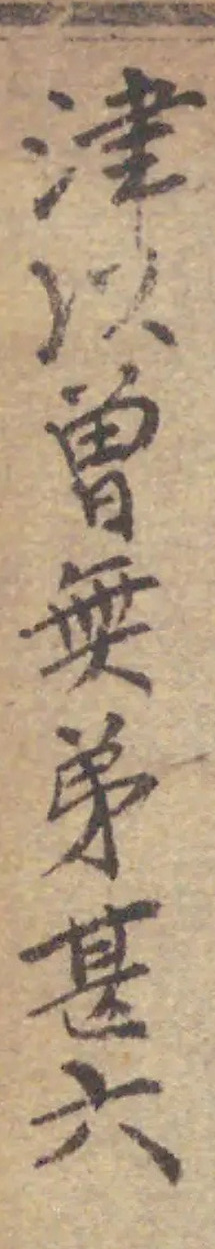津以曽無弟甚六完

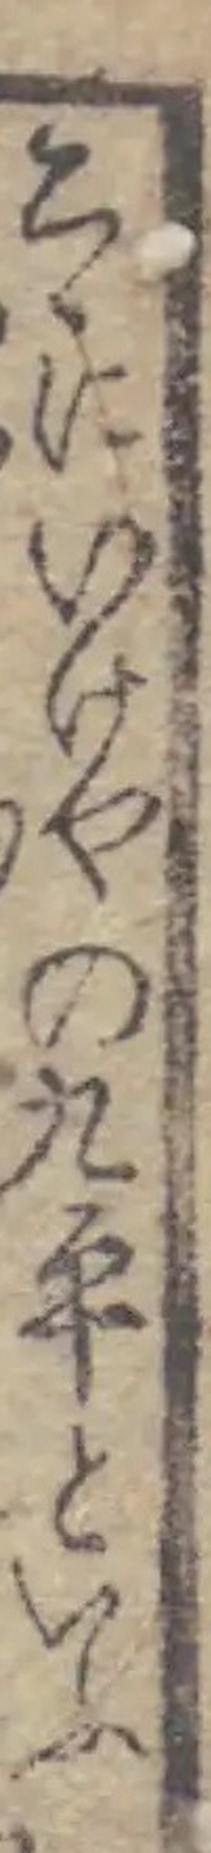こゝにいけやの九平といふ
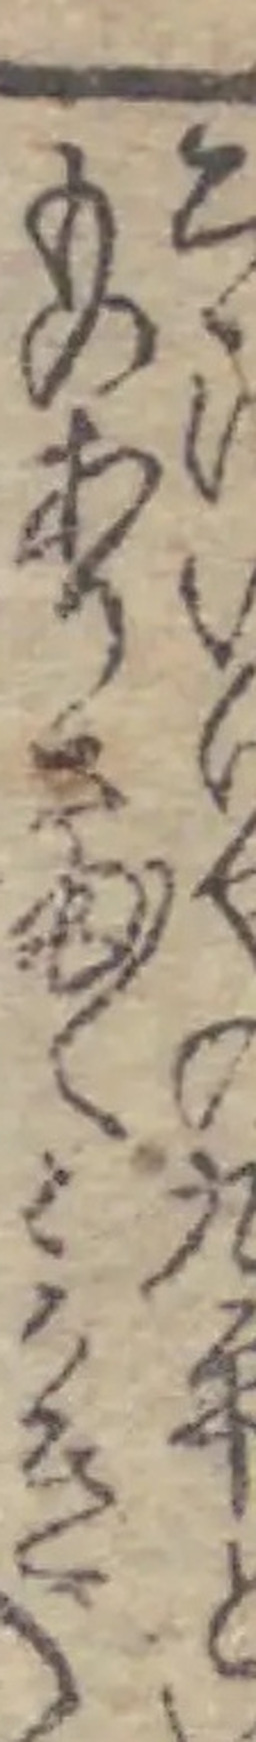ものありさま〳〵とかき
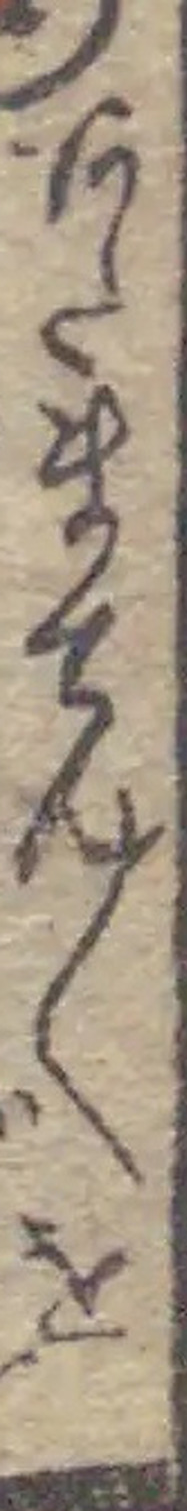あたまてん〳〵を
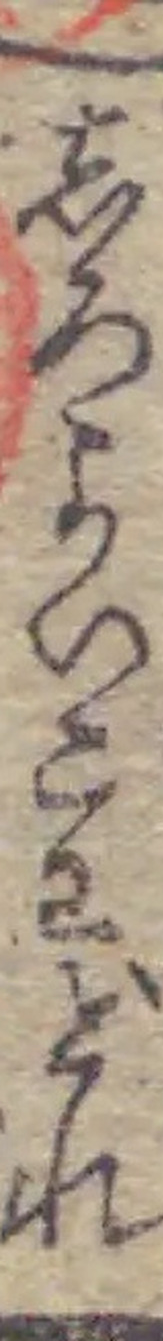しろよいこわどれ
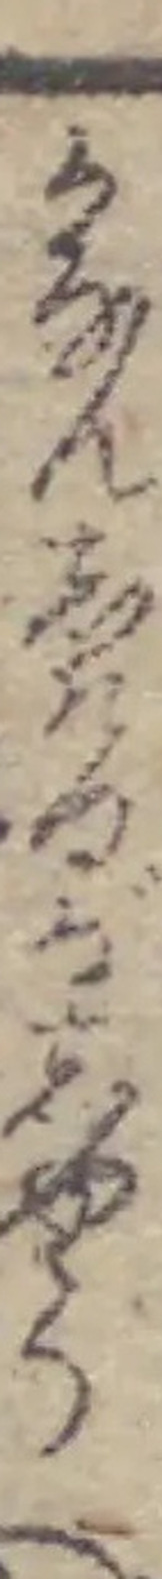かなんしけるがしやう
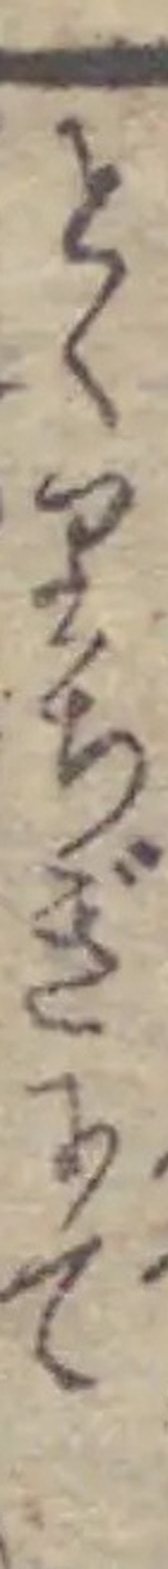とくりちぎにて
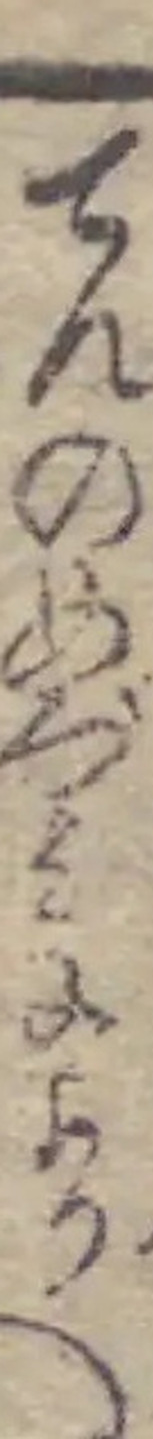てんのめぐみにより
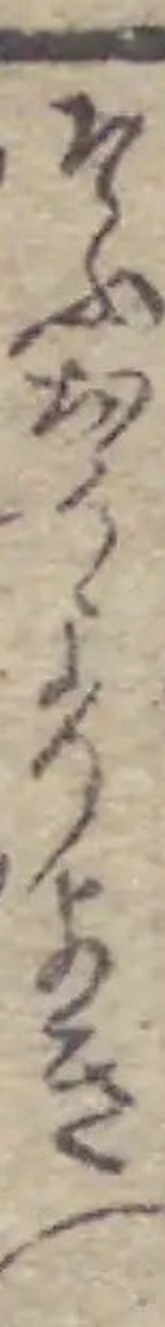そふおうよりよき
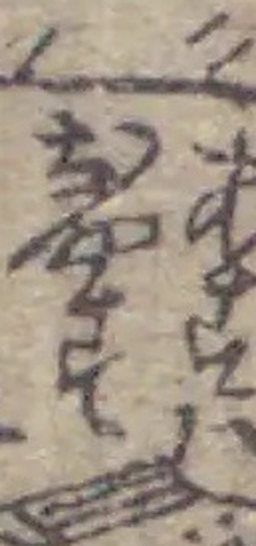おやす
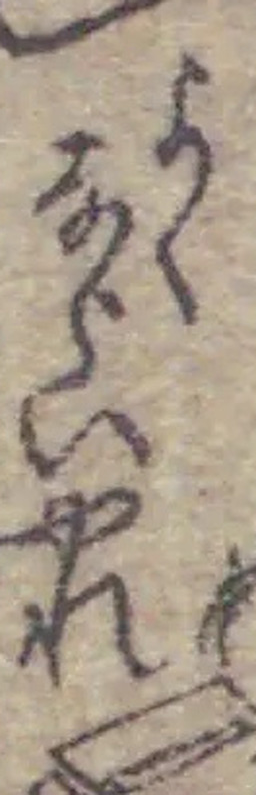ならいやれ
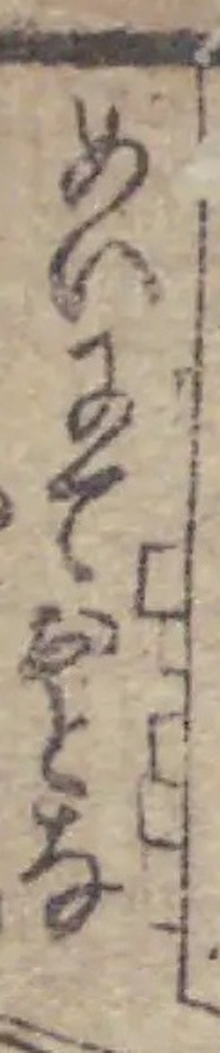めいにておとな
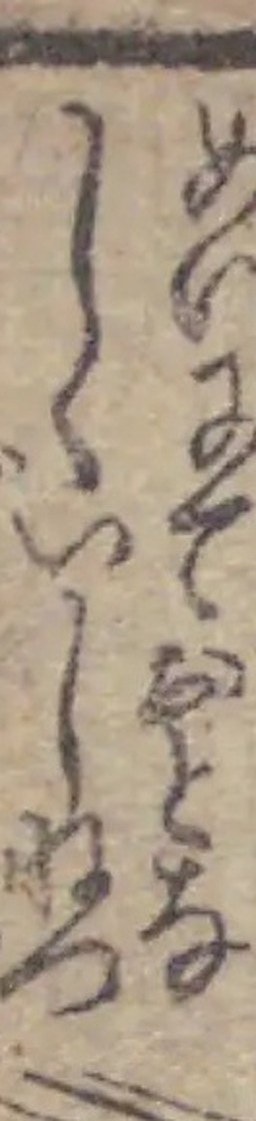しくいしねつき
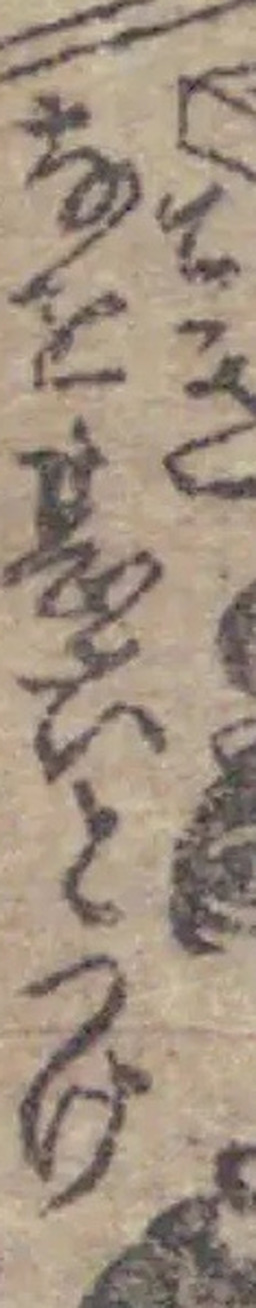なを甚六とつけ
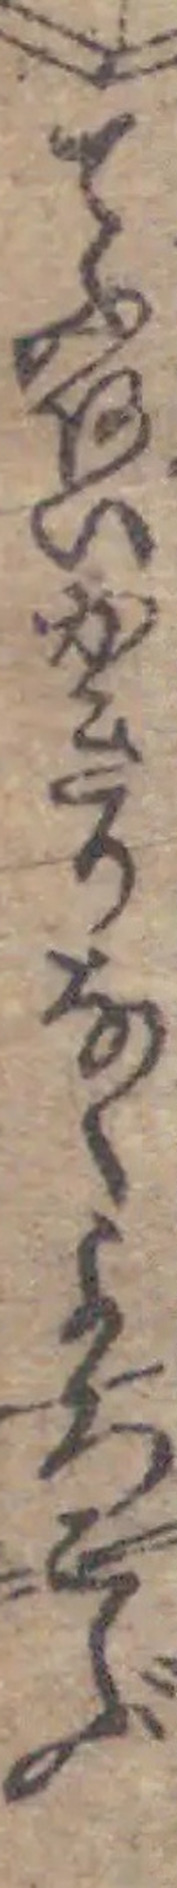てふあいかきりなくよろこぶ

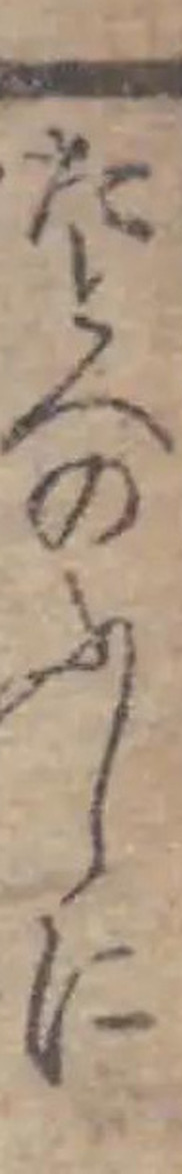たとへのふしに
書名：津以曽無弟の甚六 3巻
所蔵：国立国会図書館 National Diet Library, JAPAN
